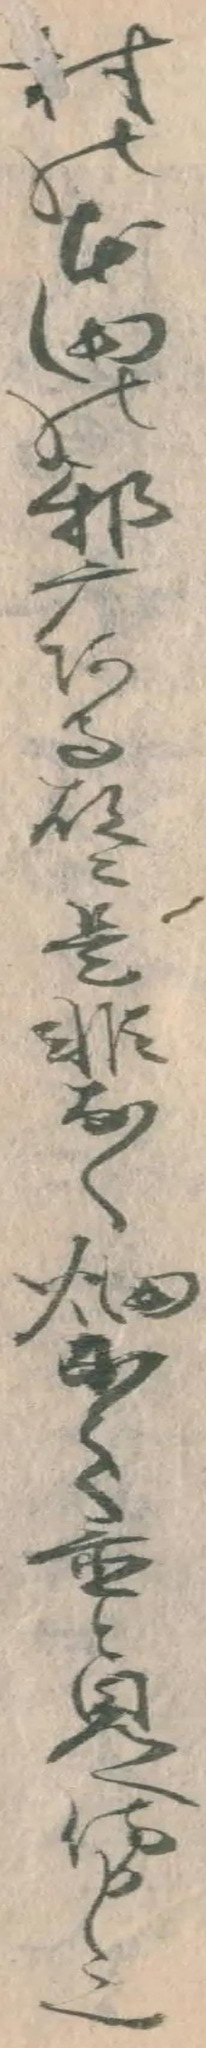村の本田の邪魔ある故に是非なく畑にて置くと見へ侍りし也
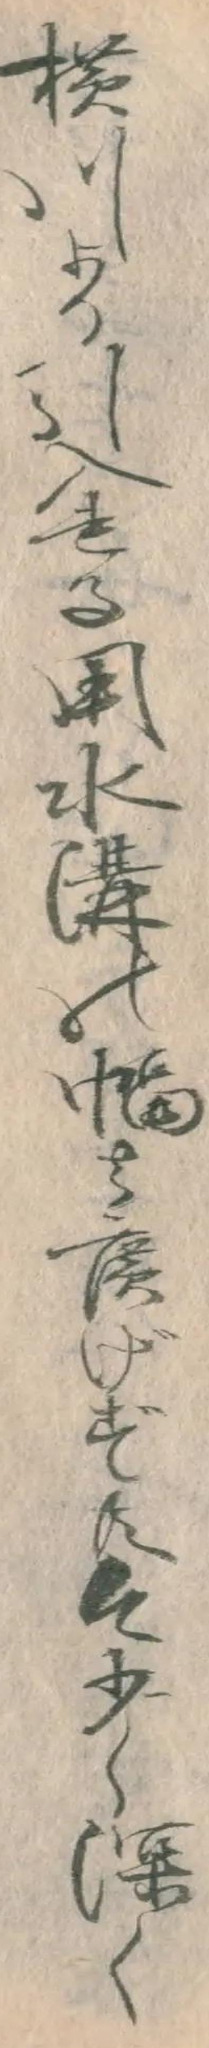横川より引入れる用水溝の幅は広げず共今少し深く
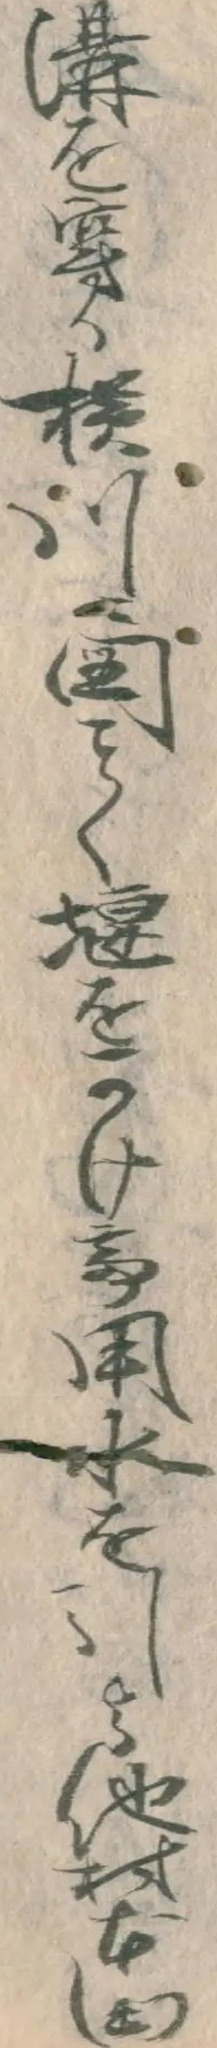溝を穿り横川に図ことく堰をかけて用水を引は他村本田
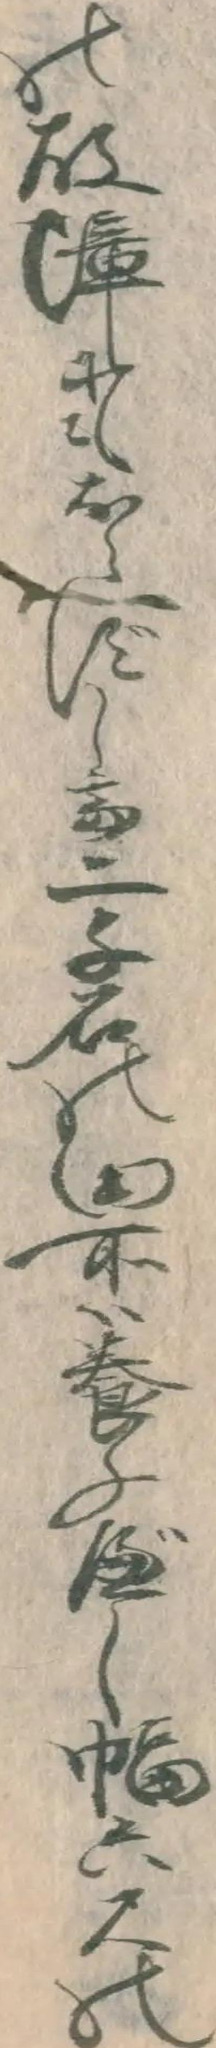の故障にもならずして二千石の田所は養ふべし幅六尺の

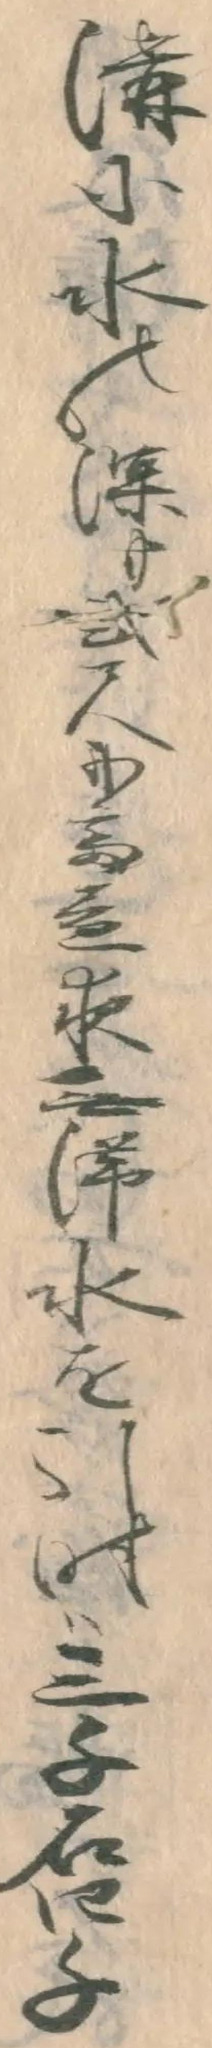溝に水の深さ弐尺にて昼夜無滞水を引時は三千石四千
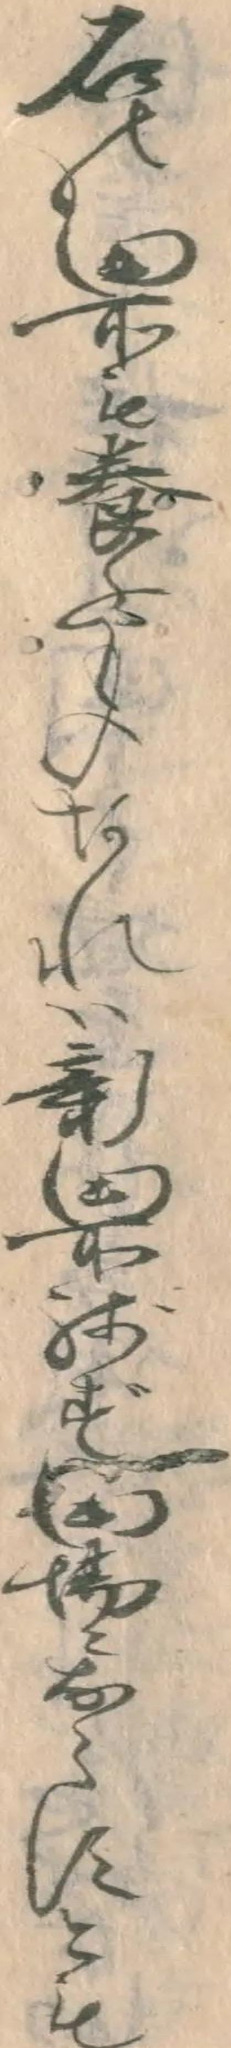石の田所も養ふものなれは新田所残ず田場にならすとも
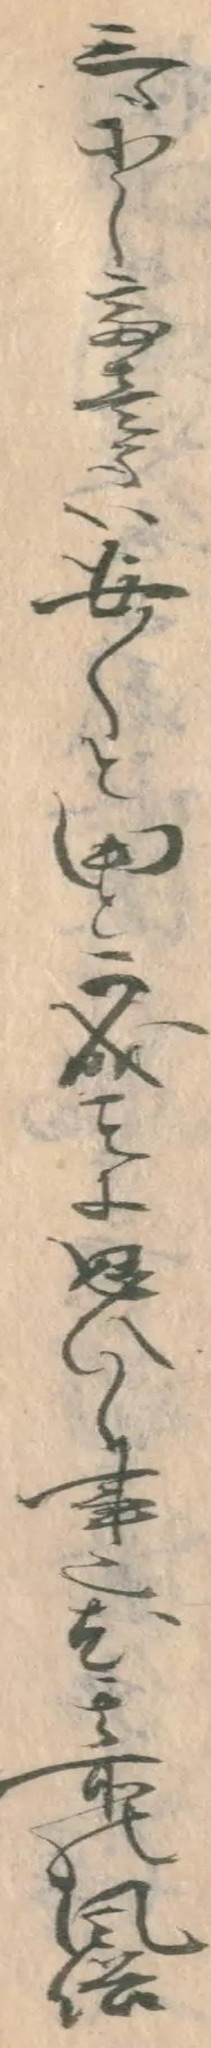三つにして壱つハ安〳〵と田と可成ことに思ひし事也尤其所の風俗
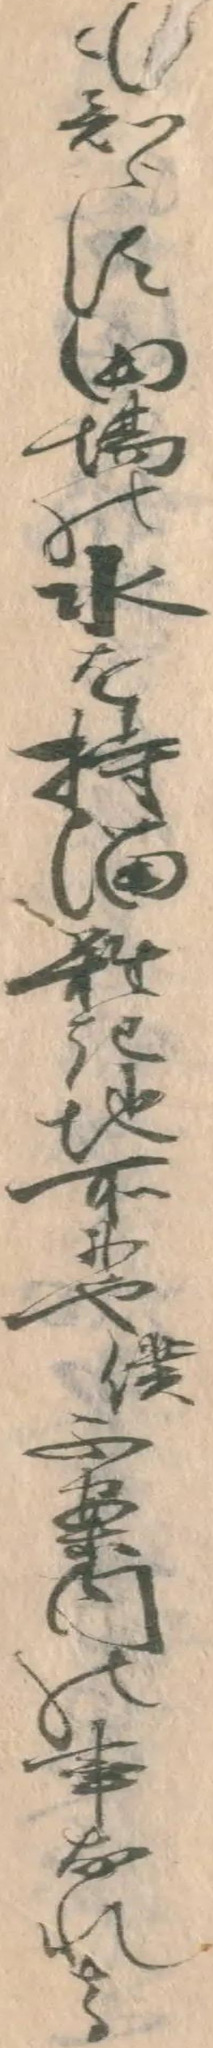も知らす田場の水を持溜雑き地所にや僕不案内の事なれは
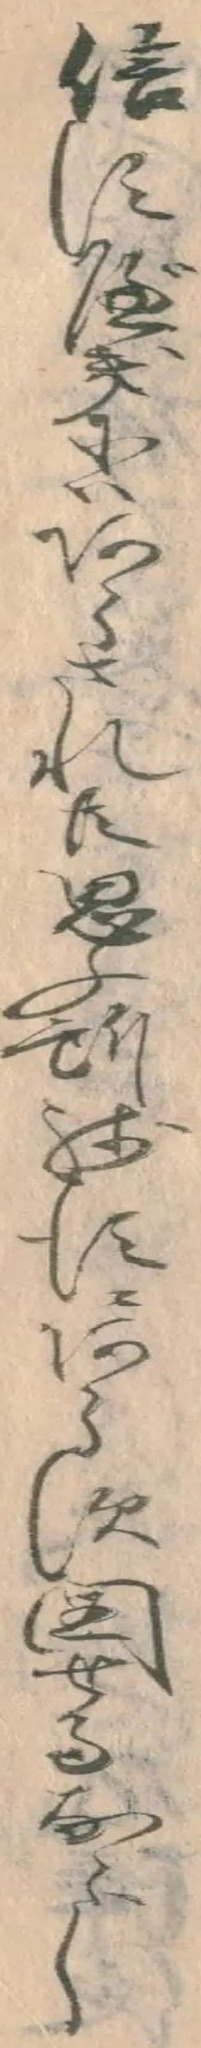信すべへきにはあらされ共思ふ所残すにあらす図せるならし
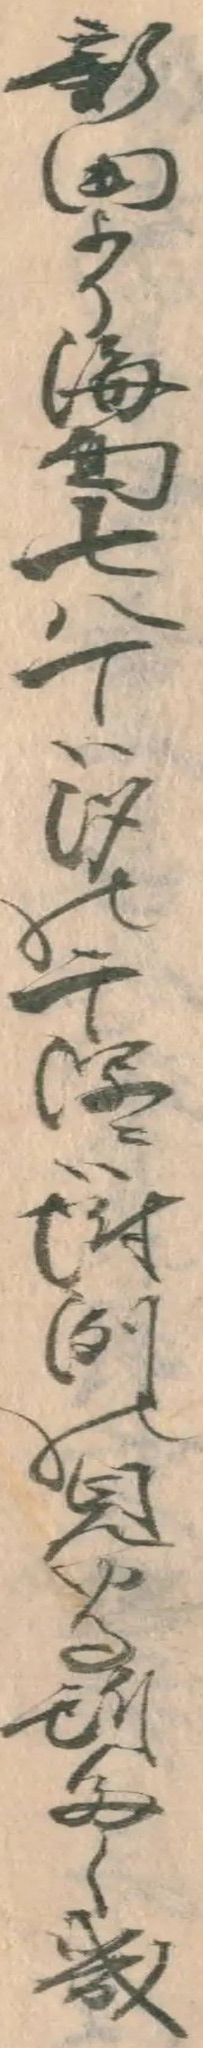新田より海面七八丁は汐の干潟には附洲の見ゆる形多く幾
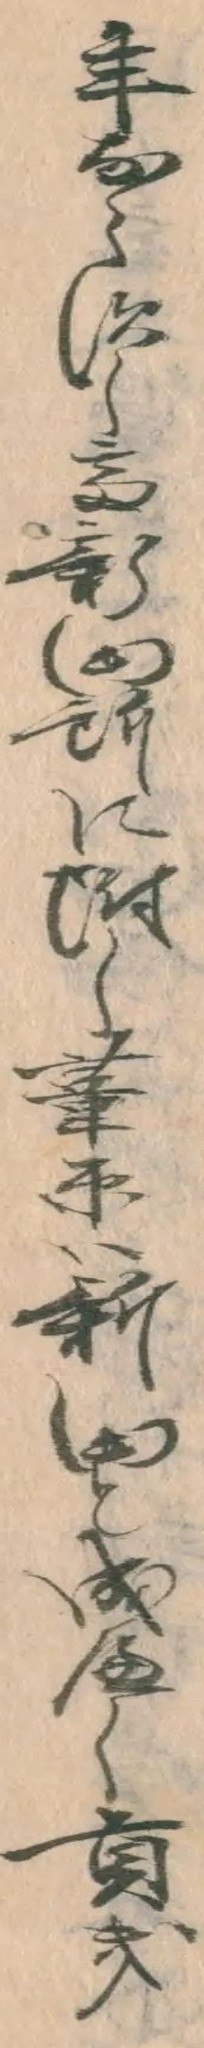年ならすして新田所に附し葦原は新田と成へく貢き
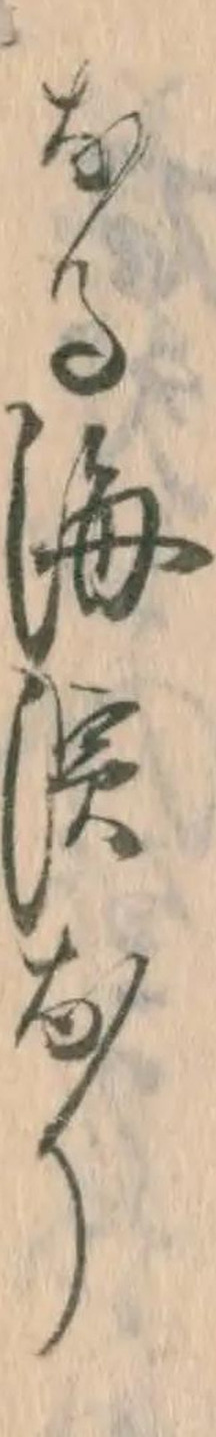なる海浜なり
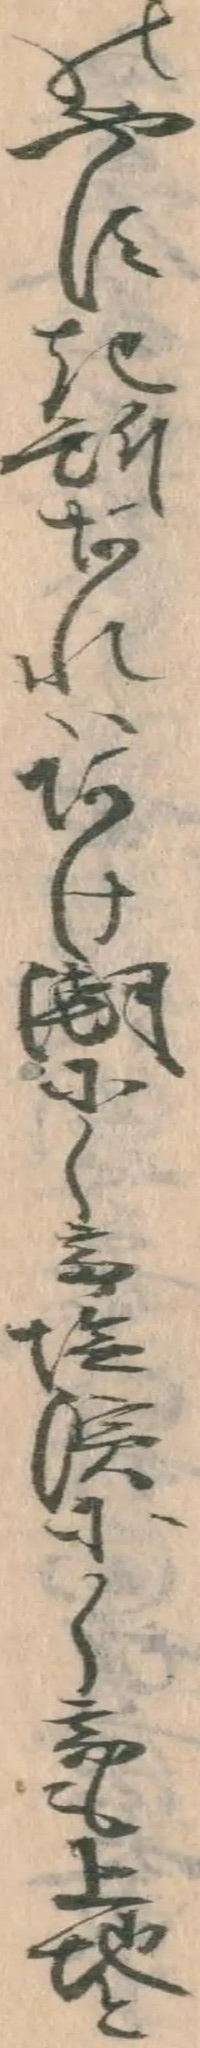のやすき所なれはあけ潮にして塩浜にしても上地と
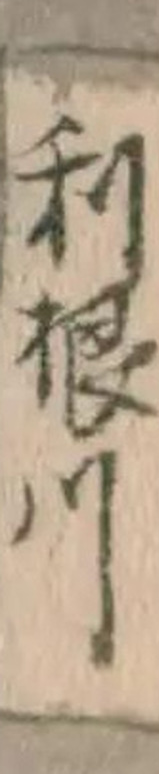利根川
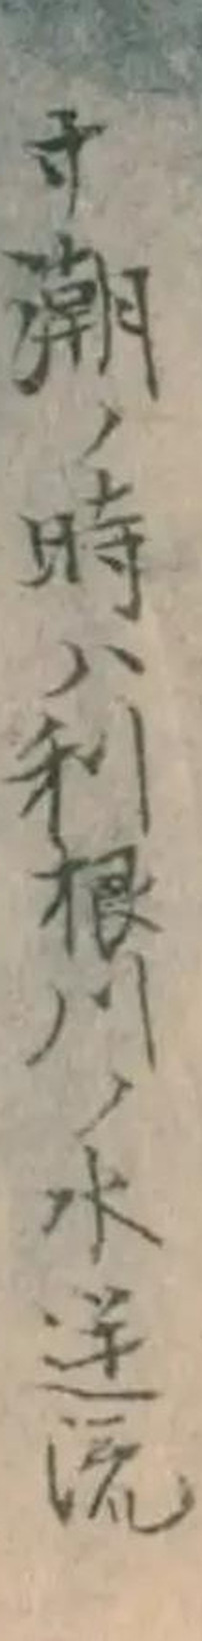寸潮ノ時ハ利根川ノ水逆流
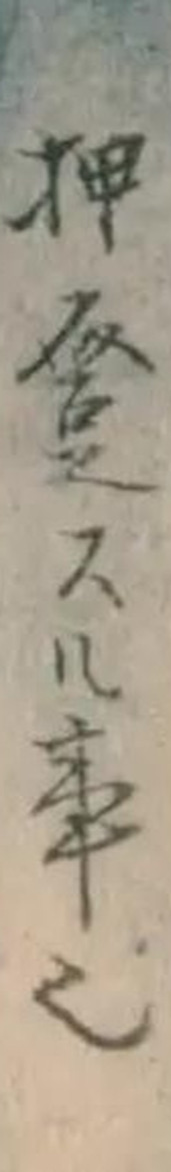押登スル事也
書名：四神地名録 6巻. [4]葛飾郡
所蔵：国立国会図書館 National Diet Library, JAPAN
